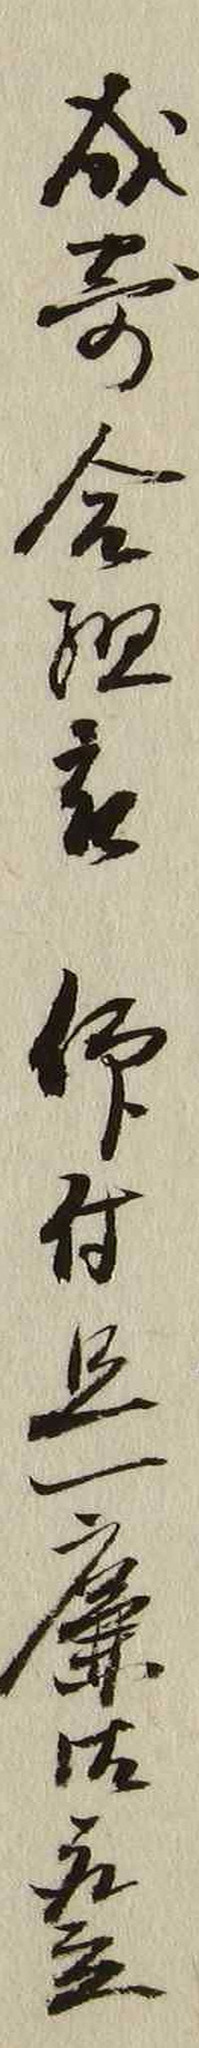成寄合組被仰付且一廉御取立
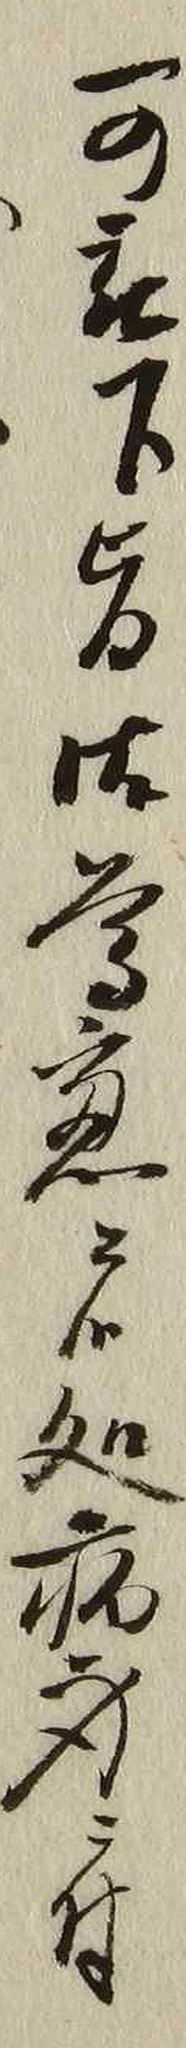可被下旨御尊慮ニ候処病身ニ付
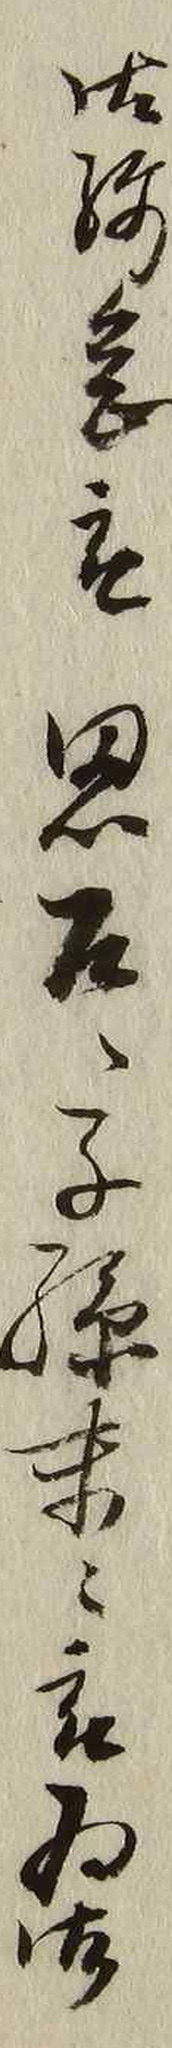御残念被思召候子孫末々被為御
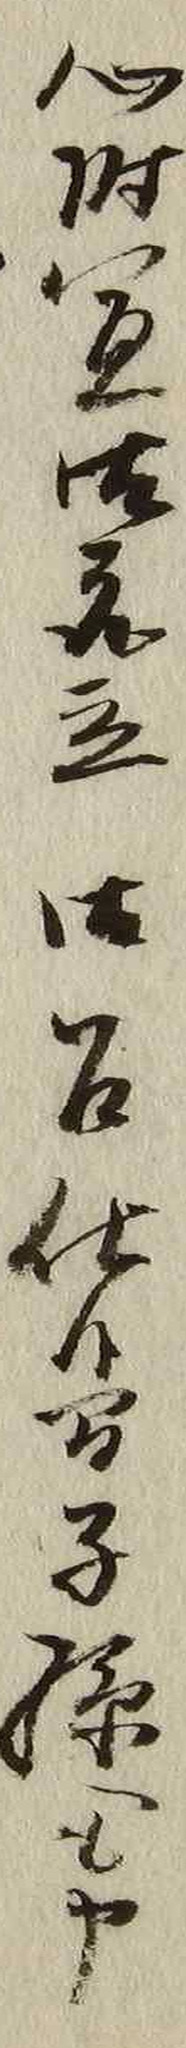心附宜御取立御召仕候間子孫へも申
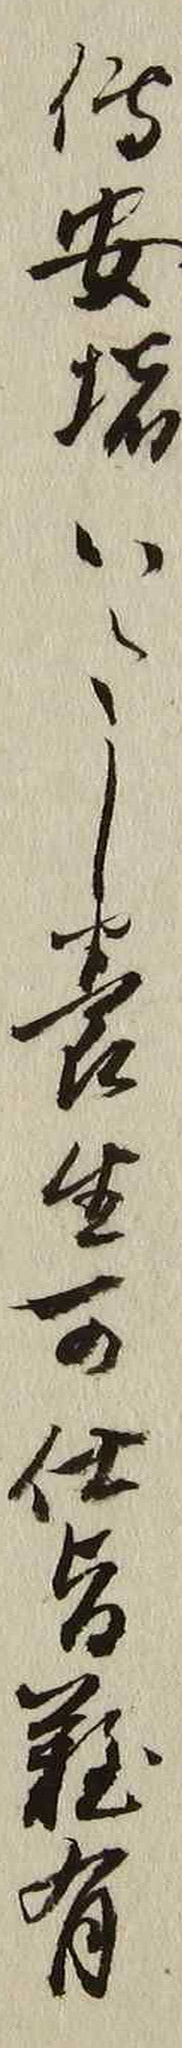伝安堵いたし養生可仕旨難有
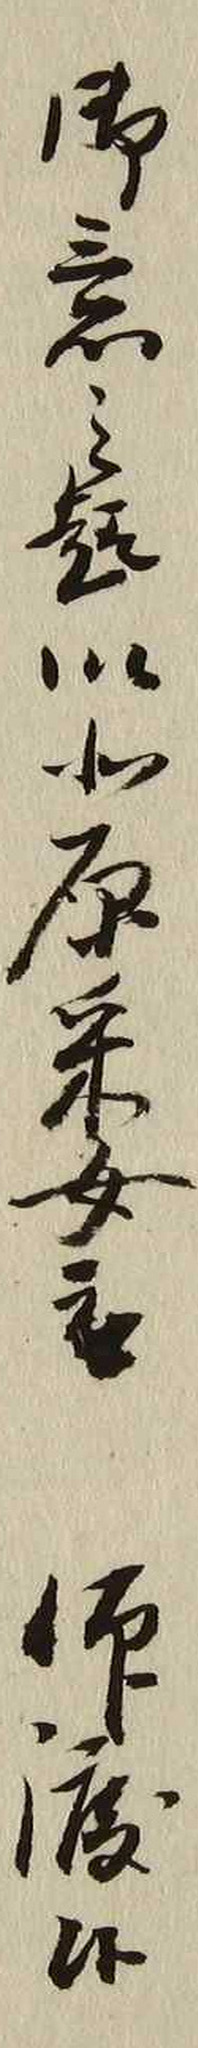御意之趣以北原采女被仰渡候
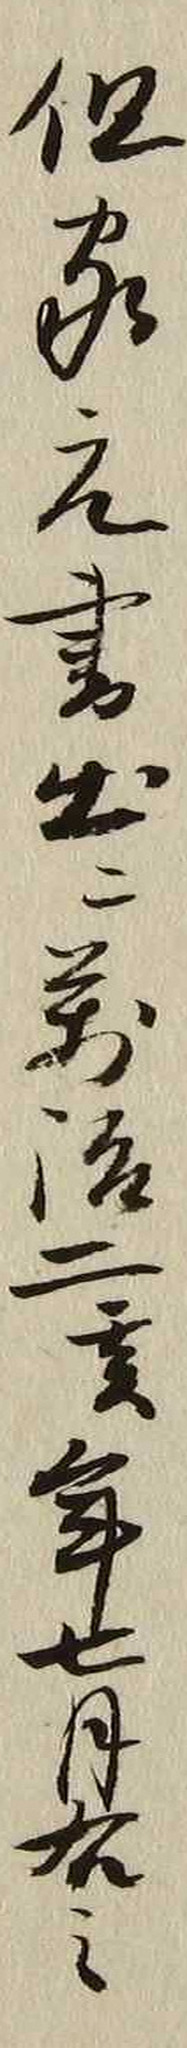但家元書出ニ万治二亥年七月右之
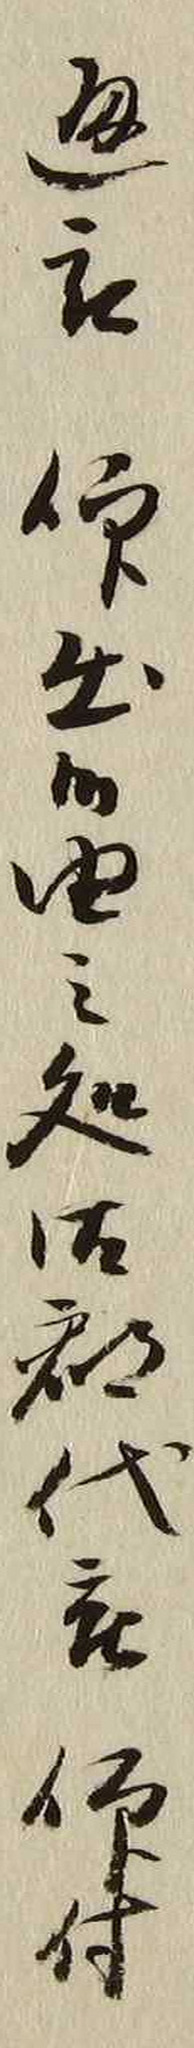通被仰出候由之処御郡代被仰付
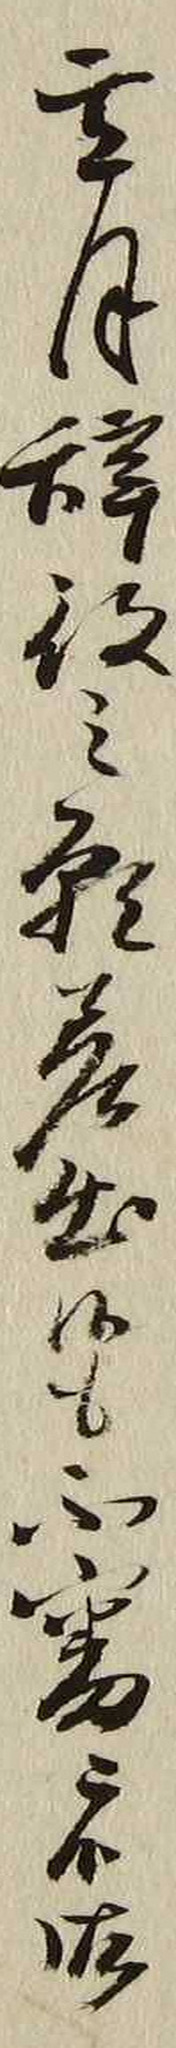其月辞役之願差出候も不審ニ候御
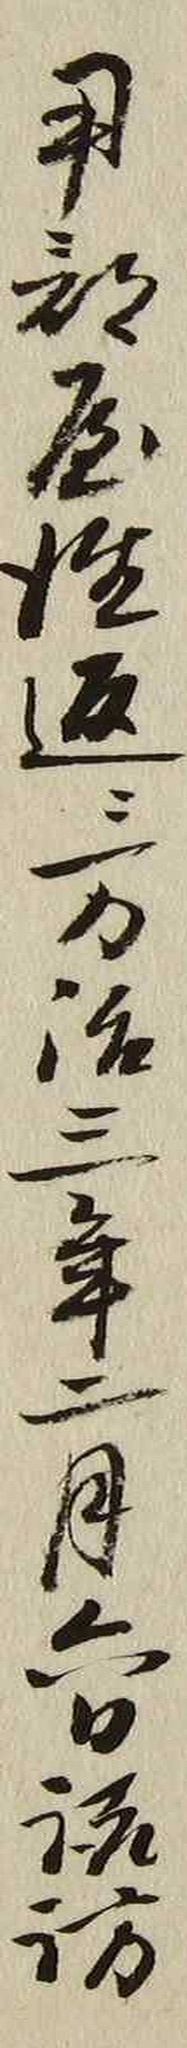用部屋往返ニ万治三年二月六日諏訪
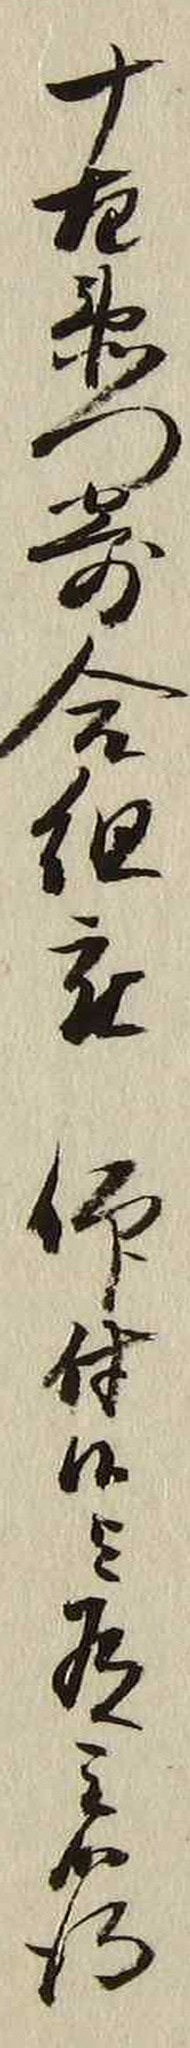十左衛門寄合組被仰付候与有之候得
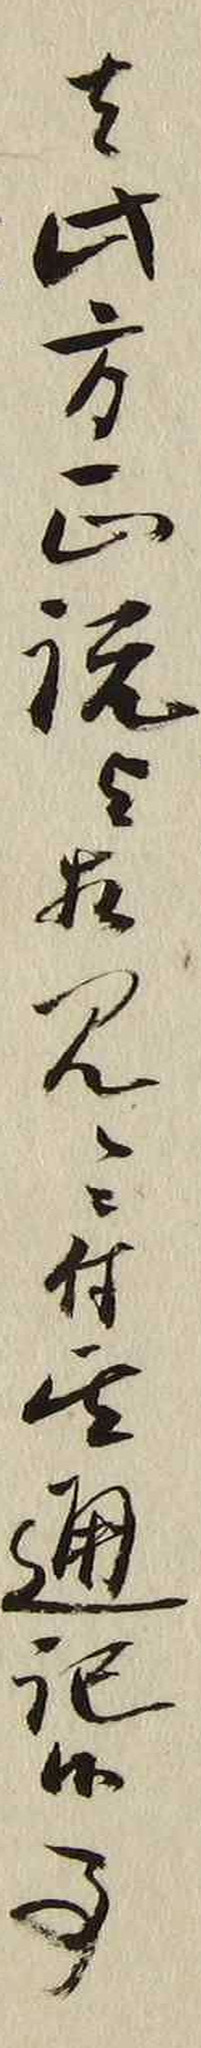者此方正説与相見候ニ付其通記候事
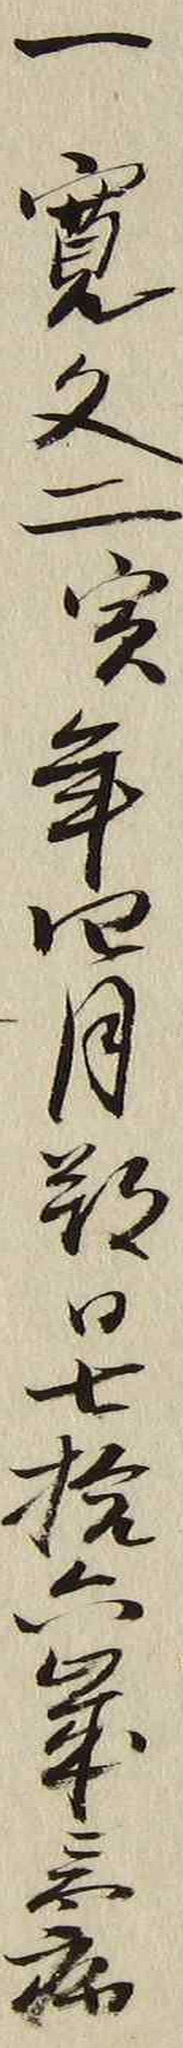一寛文二寅年四月朔日七拾六歳ニ而病
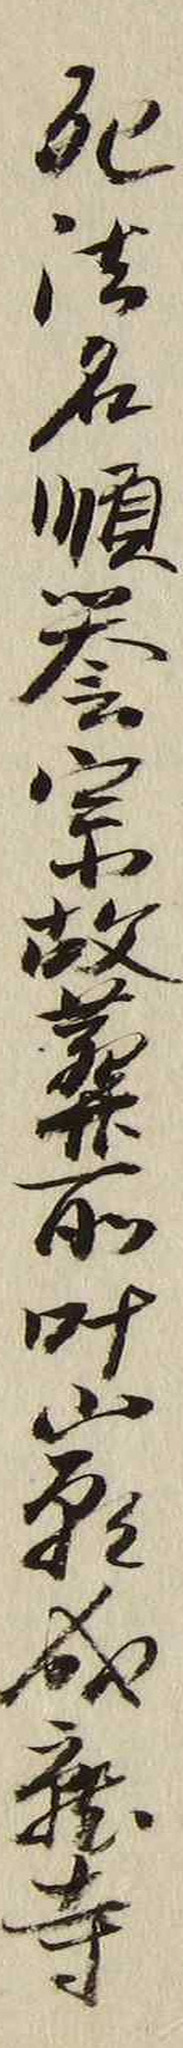死法名順誉宗故葬所叶山願成就寺
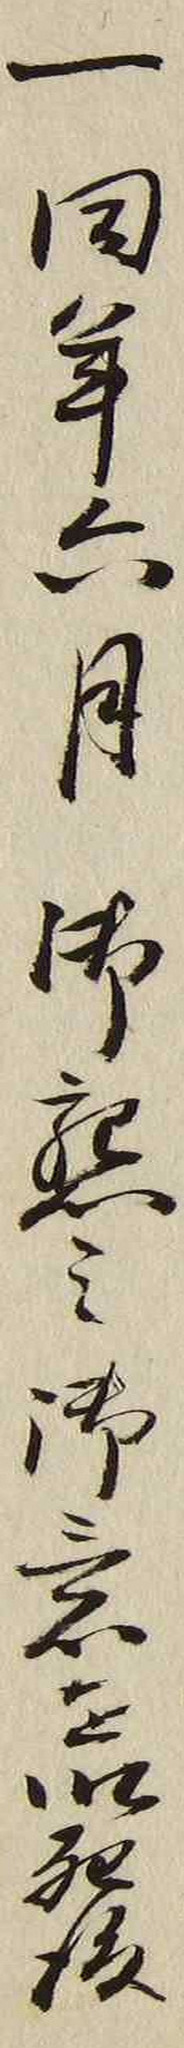一同年六月御懇之御意を以死後

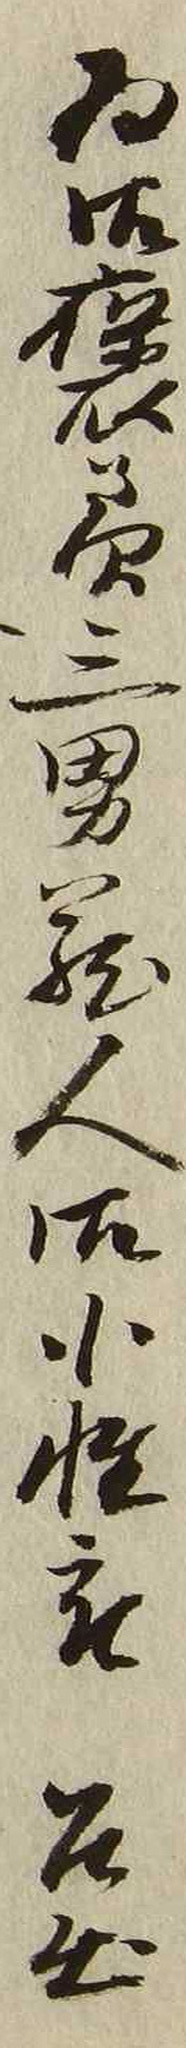為御褒美三男蔵人御小性被召出
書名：諸士系譜　巻之356　す之部6
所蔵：会津若松市立会津図書館
